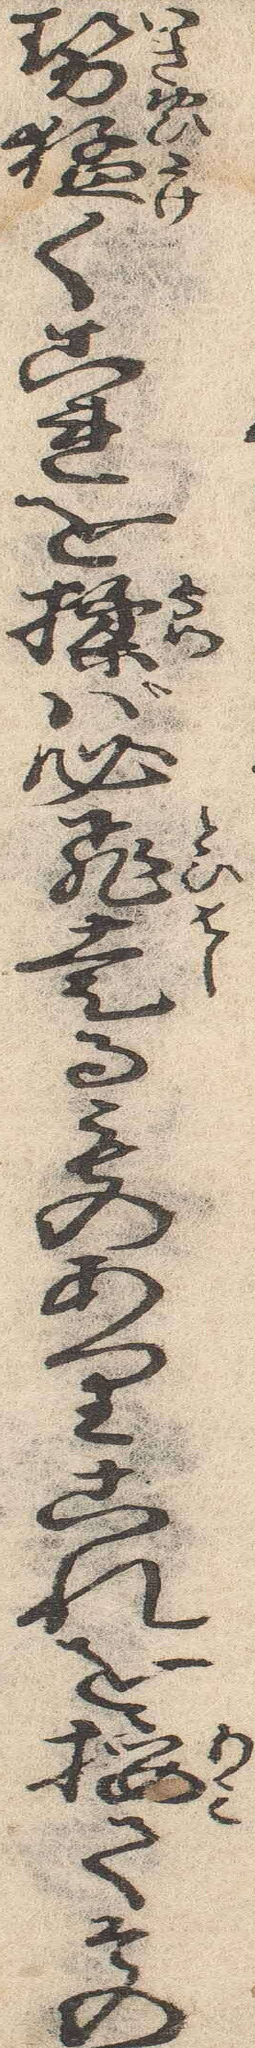㔟猛くこれを揉ば必飛走るものありこれを按てその
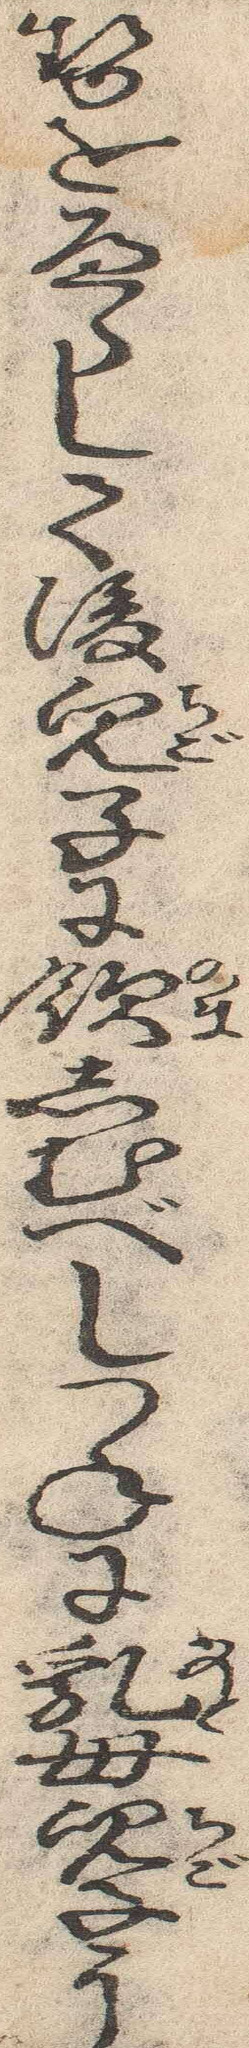㔟をへらして後児子に飲しむべしつねに乳母児子に
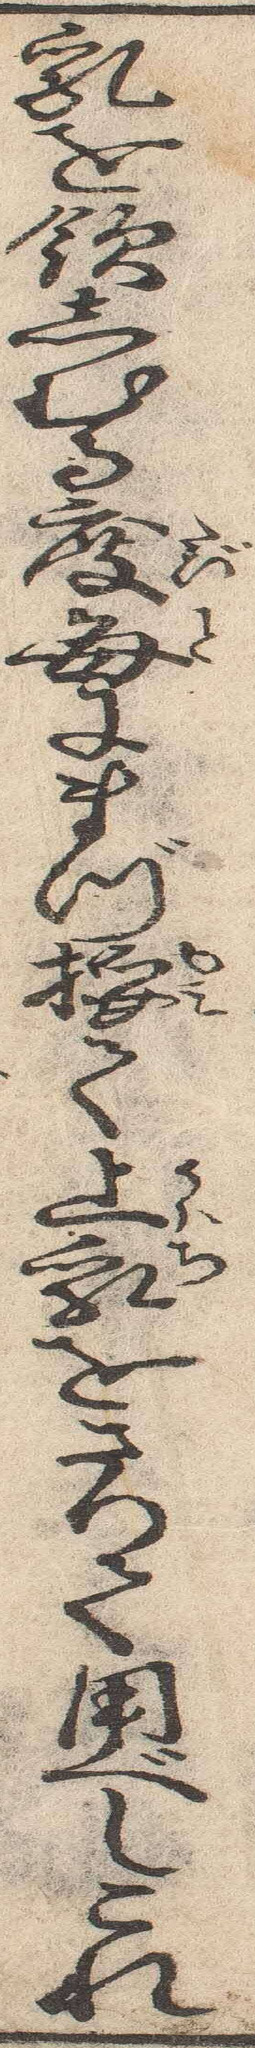乳を飲しむる度毎にまづ按て上乳をさりて用べしこれ
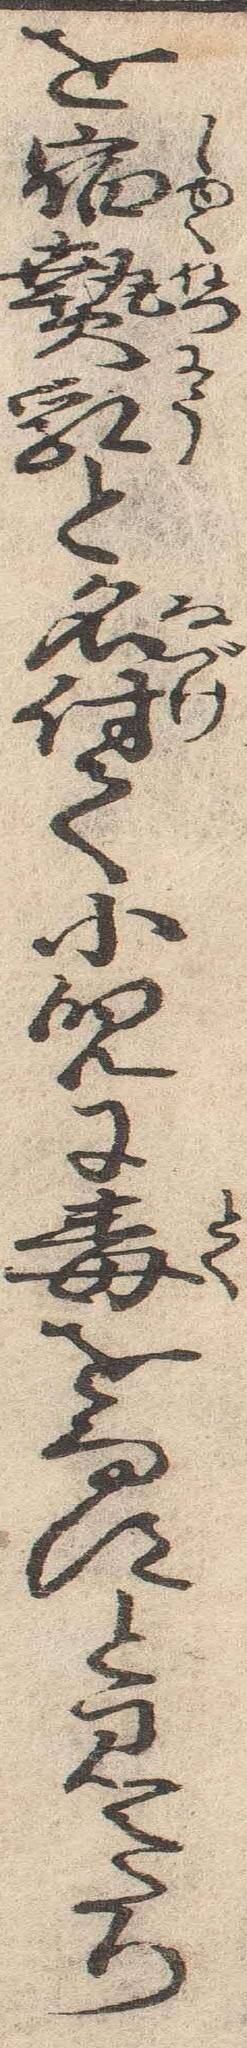を宿熱乳と名付て小児に毒をなすと見えたり
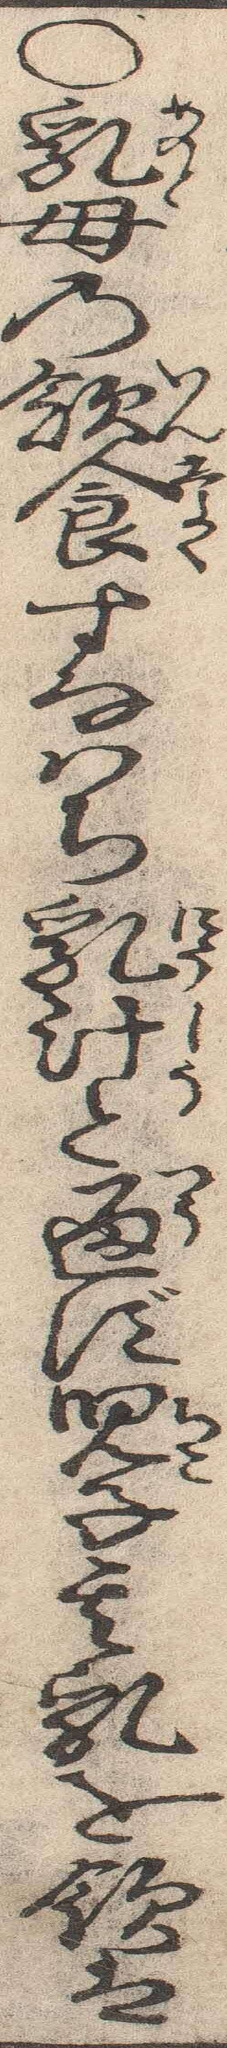◯乳母の飲食すなはち乳汁と通ず児子其乳を飲は
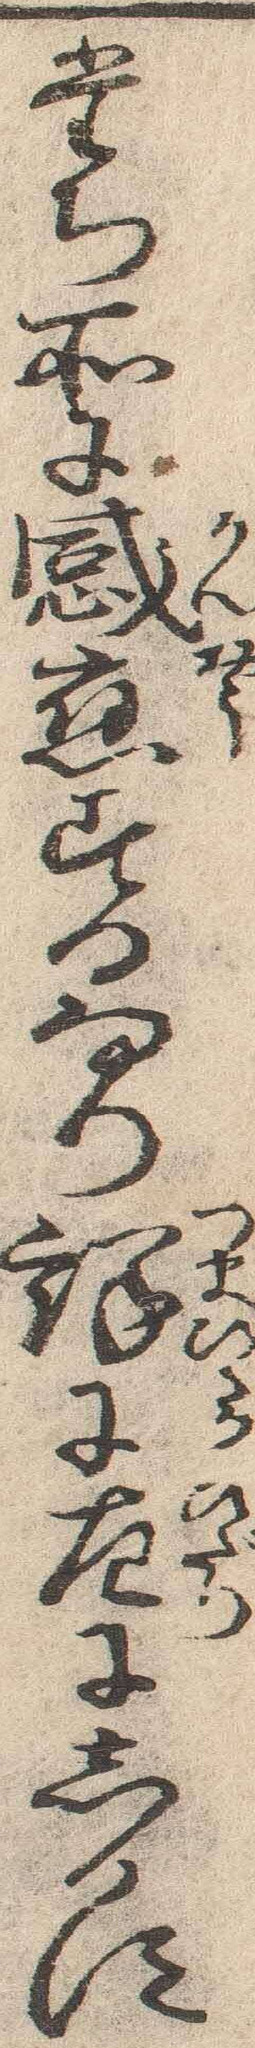たち所に感應するなり詳に左にしるす
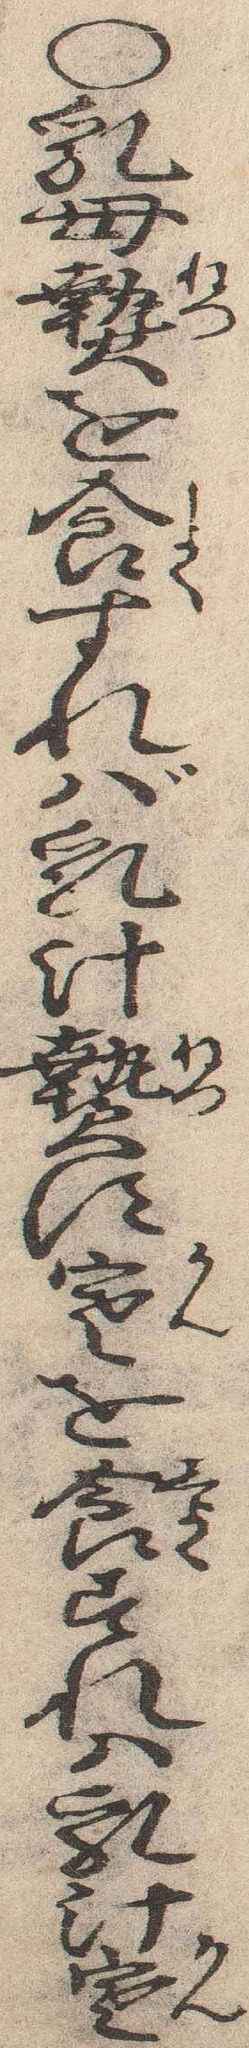◯乳母熱を食すれば乳汁熱す寒を食すれは乳汁寒

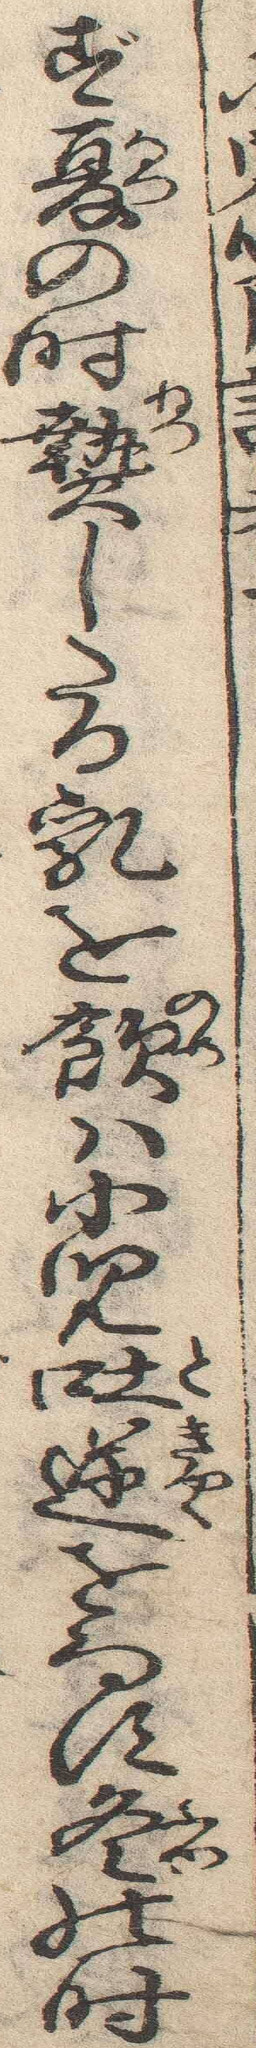ず夏の時熱したる乳を飲は小児吐逆をなす冬の時
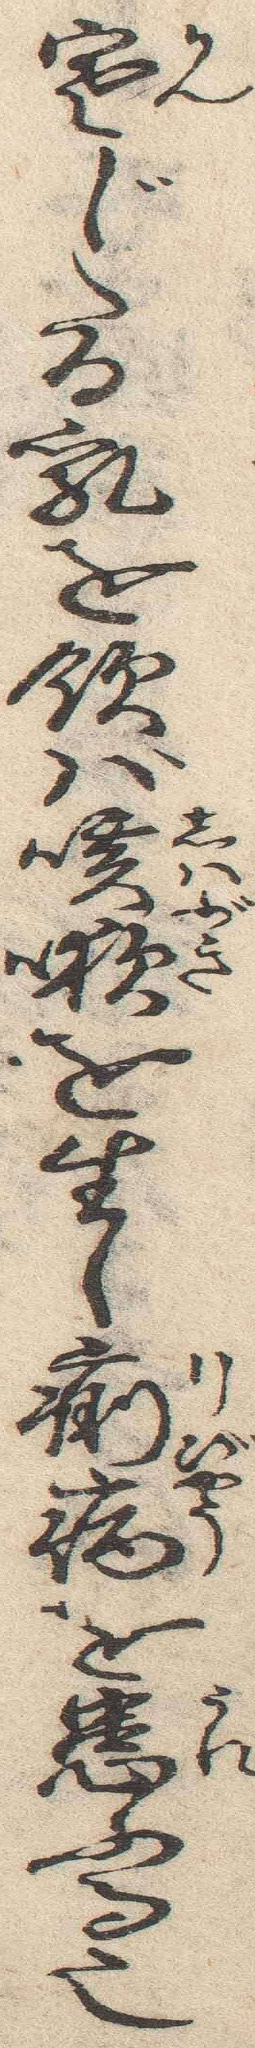寒じたる乳を飲ば咳嗽を生し痢病を患ふる也
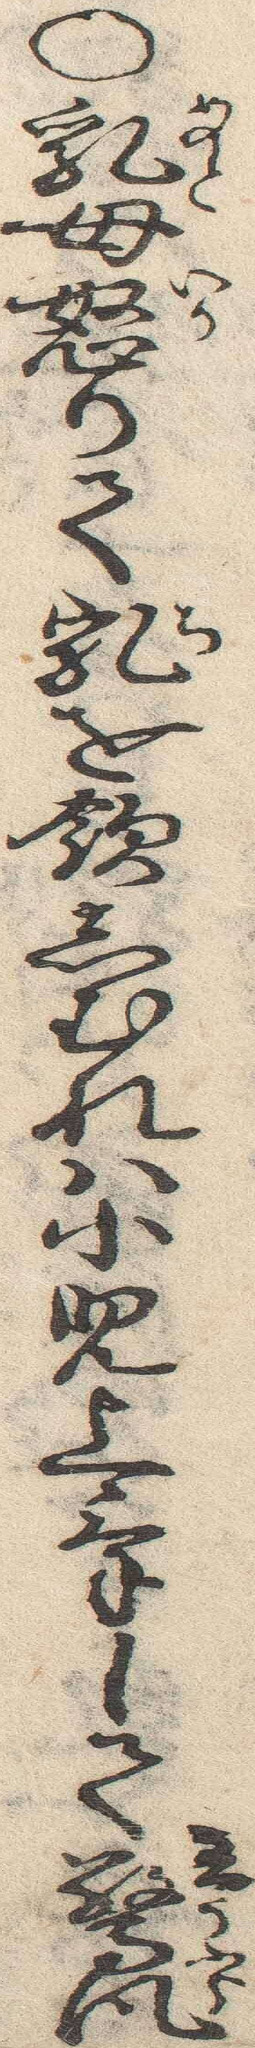◯乳母怒りて乳を飲しむれは小児上氣して驚風
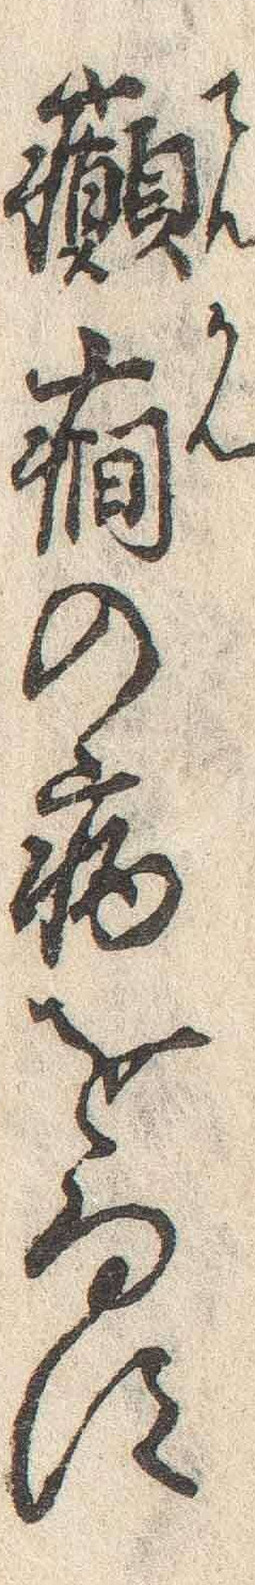癲癇の病をなす
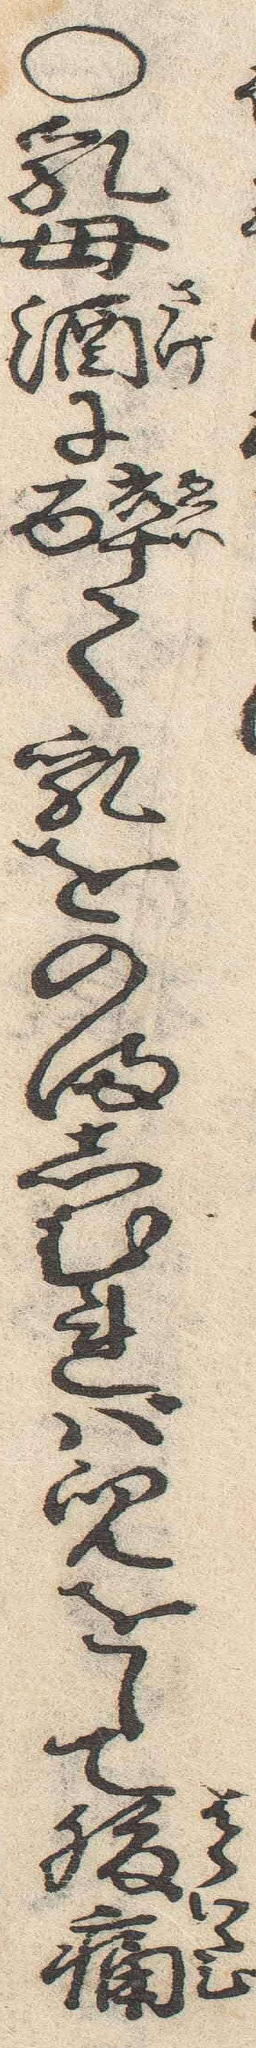◯乳母酒に醉て乳をのましむれば児をして腹痛
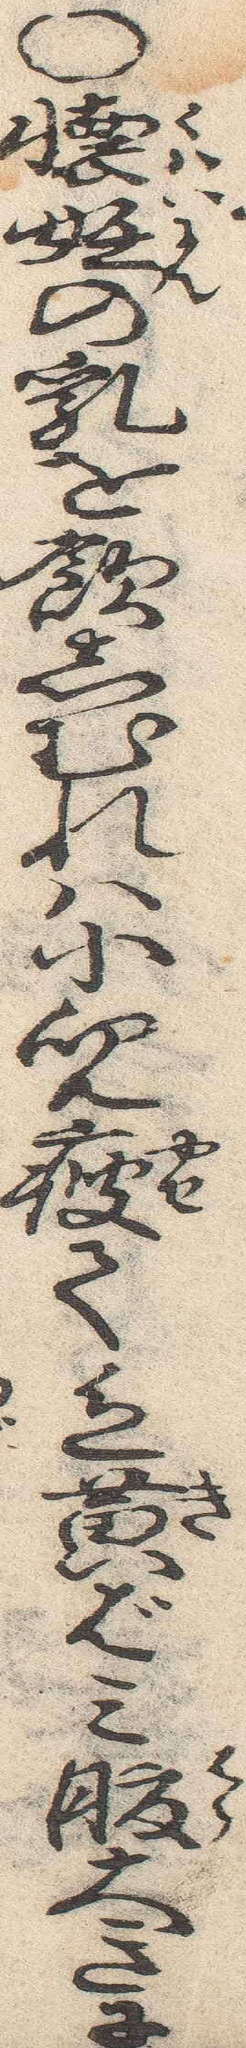◯懐妊の乳を飲しむれは小児痩て色黄ばみ腹大きに
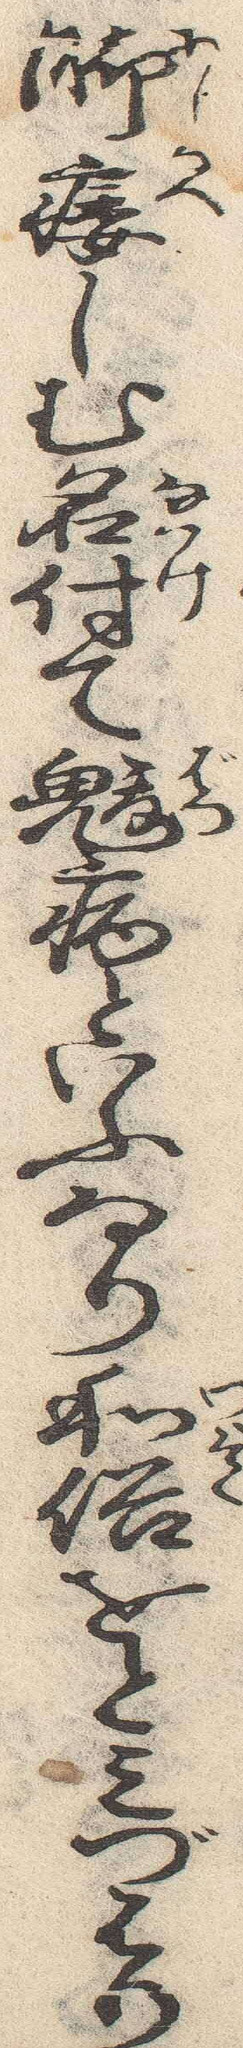脚痿しむ名付て魃病といふなり和俗をとみづはり
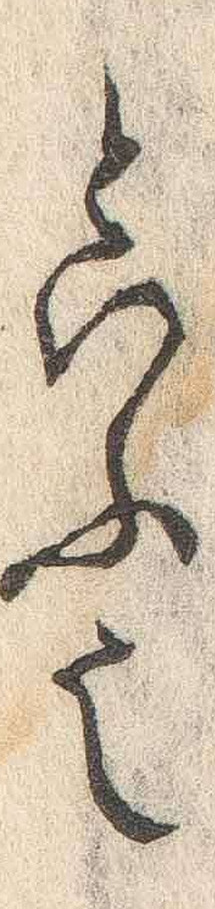といふ也
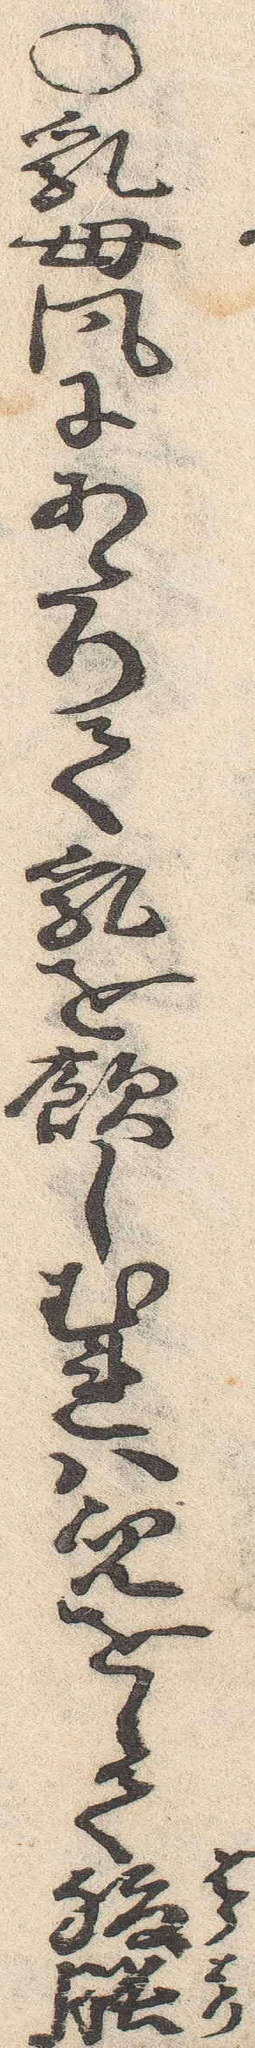◯乳母風にあたりて乳を飲しむれは児をして腹張
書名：小児必用養育草
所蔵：東京学芸大学附属図書館 国文学研究資料館
